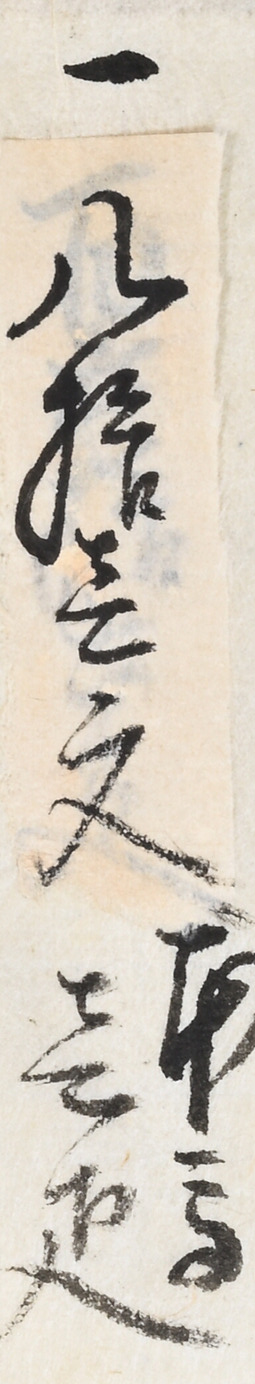一八拾壱文壱疋
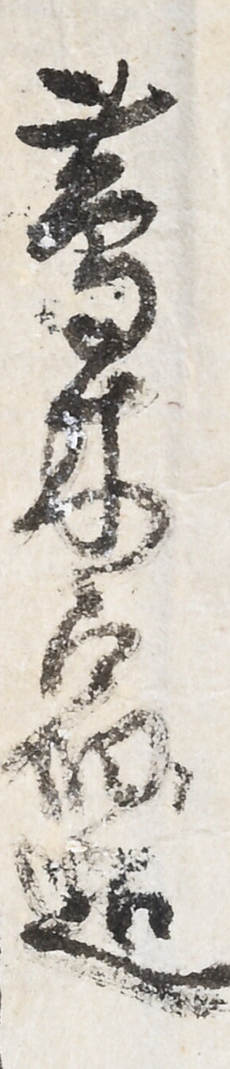蔦木宿迄
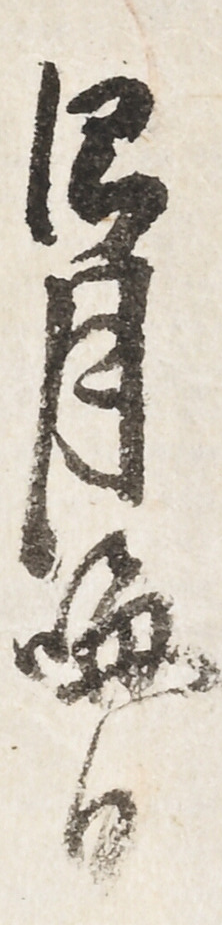四月晦日
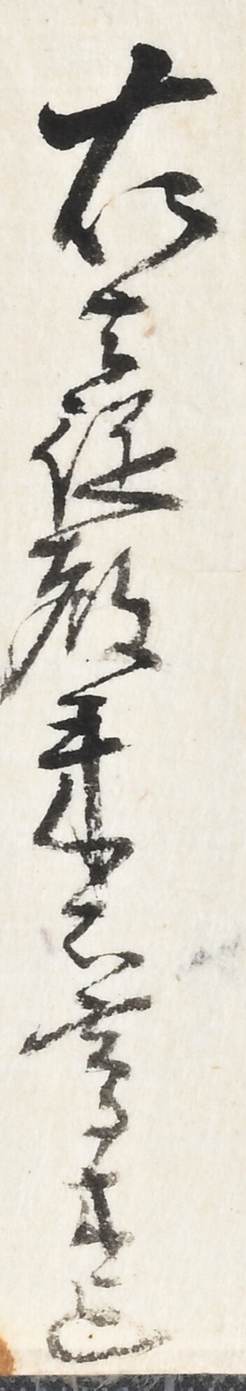右者従教来石蔦木迄
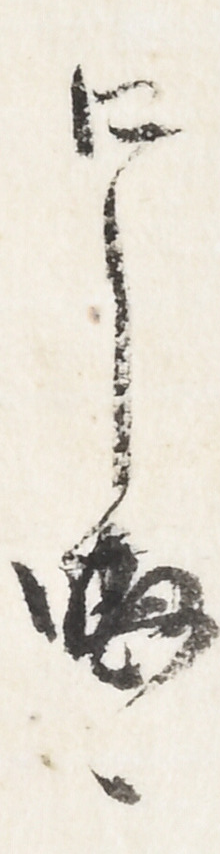四月晦日

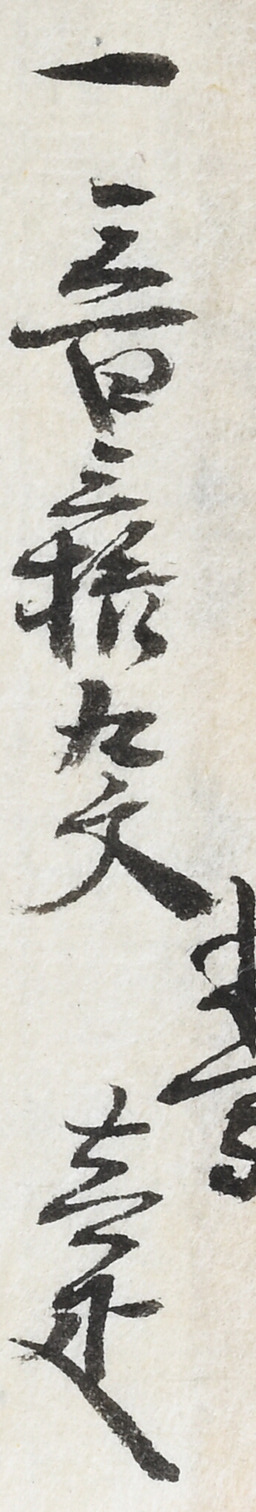一三百参拾九文壱疋
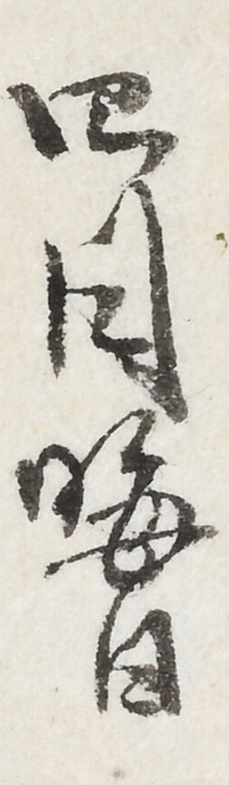四月晦日
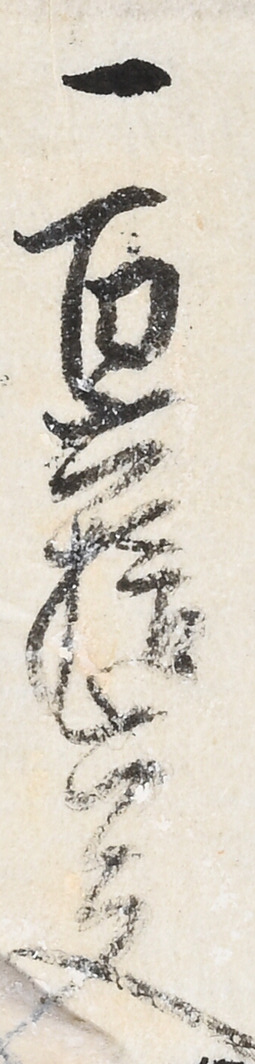一百六拾六文疋
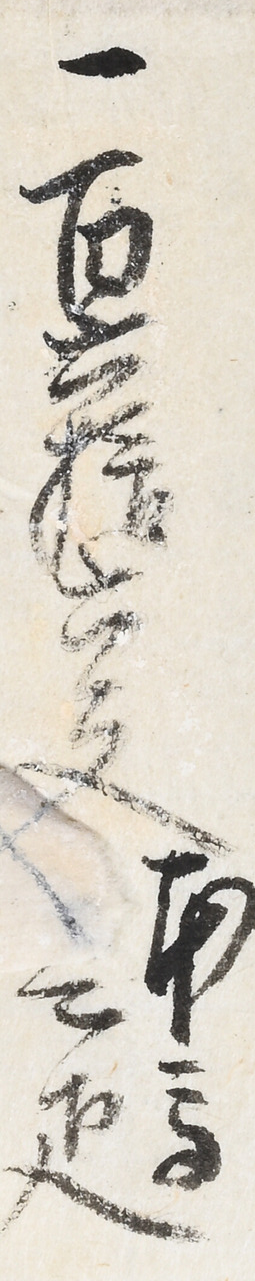一百六拾六文疋
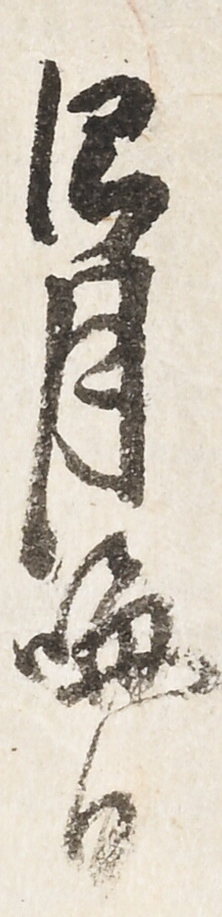四月晦日
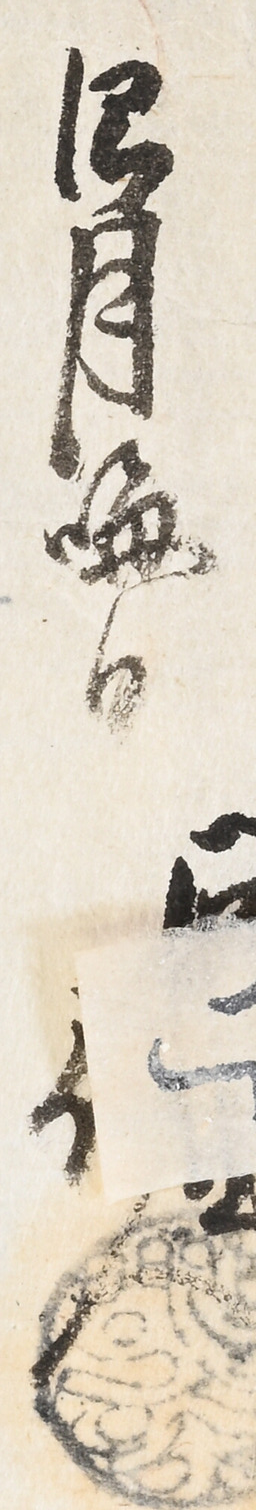四月晦日
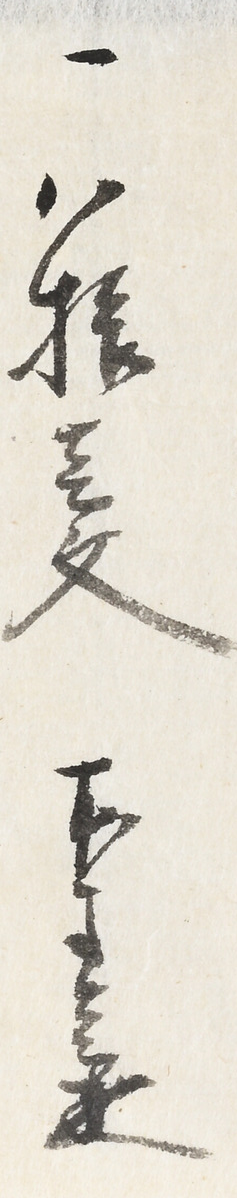一八拾壱文本馬壱疋
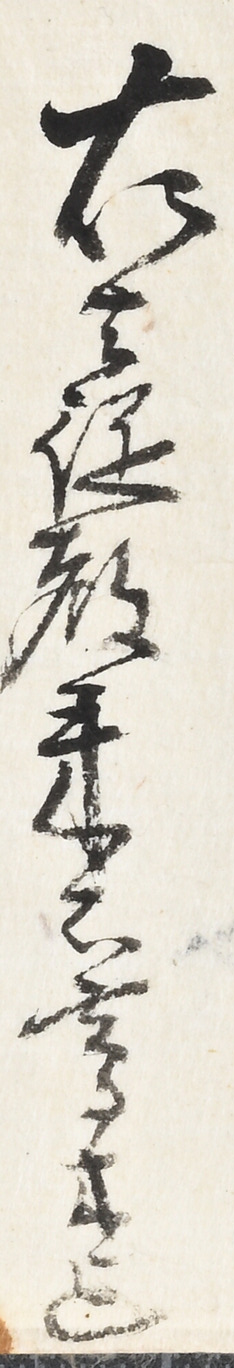右者従教来石蔦木迄
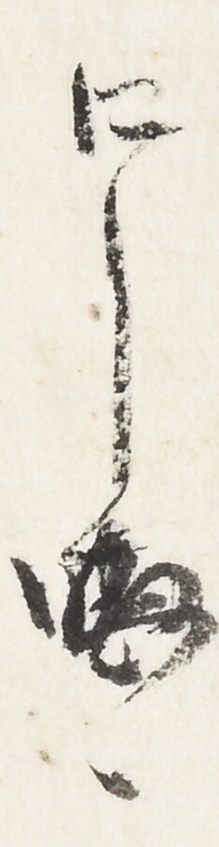四月晦日

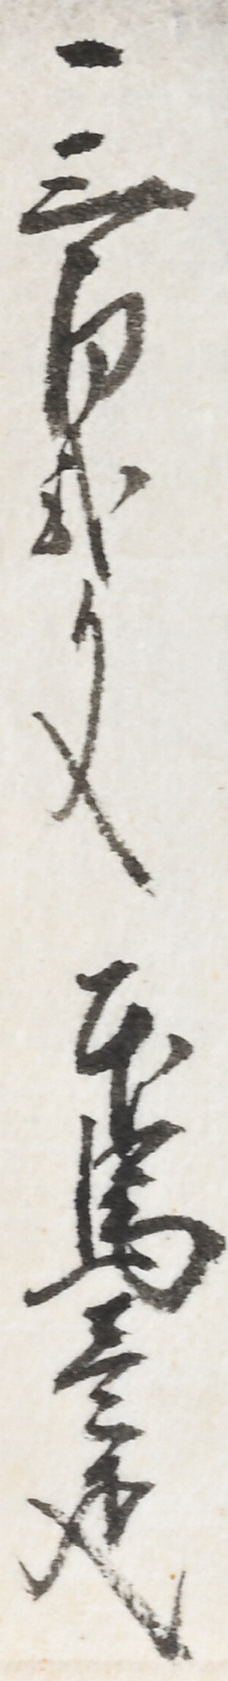一三百弐文本馬壱疋

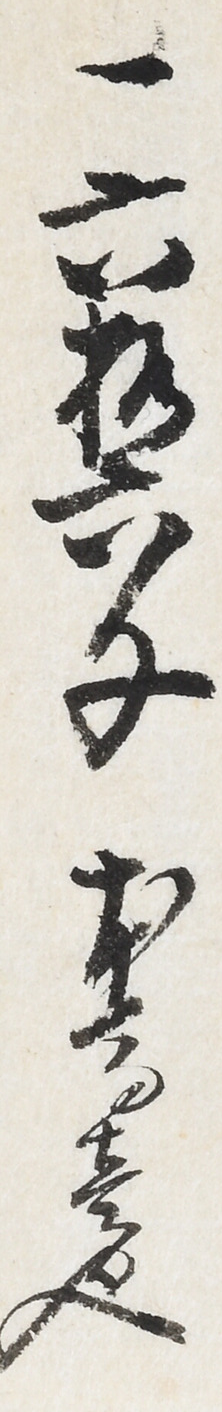一六拾六文本馬壱疋
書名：甲州通宿々駄賃払帳
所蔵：伊那市立高遠町図書館・合同会社AMANE
